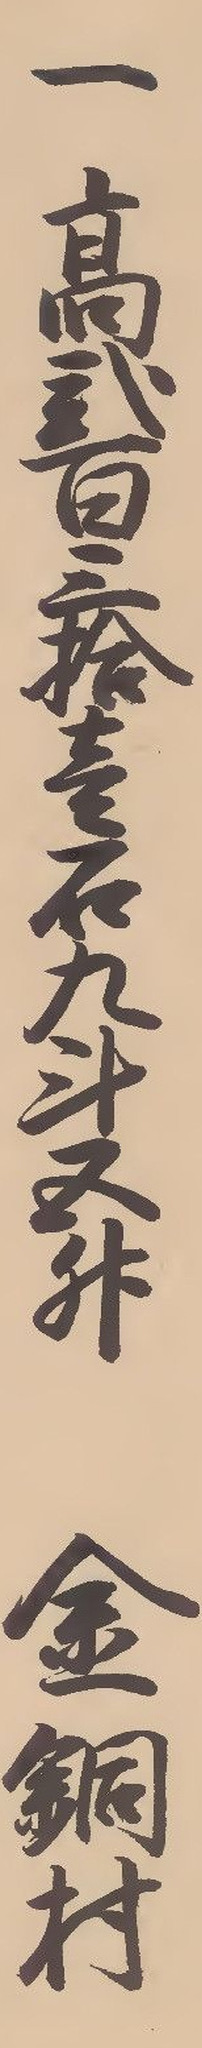一高弐百三拾壱石九斗五升金銅村

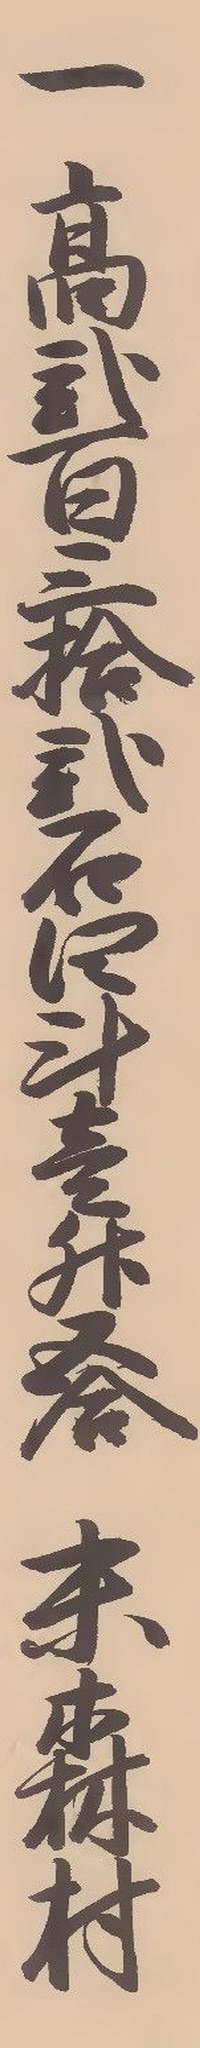一高弐百三拾弐石四斗壱升五合末森村
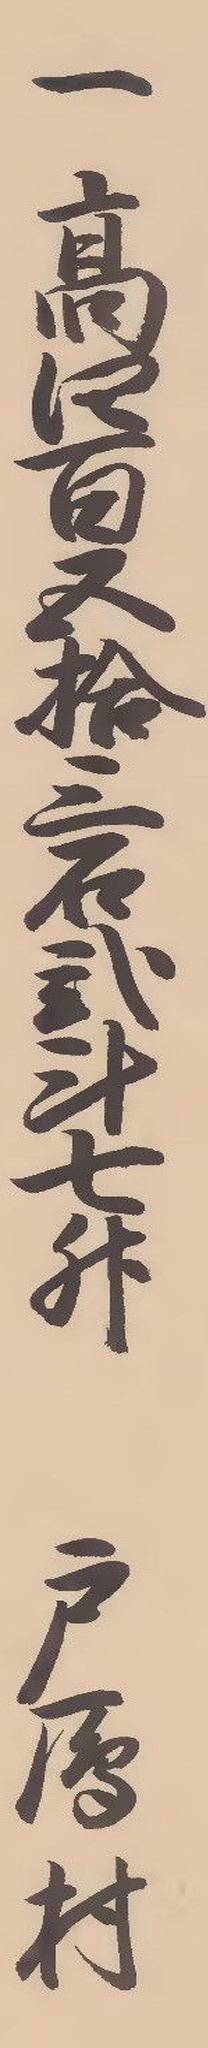一高四百五拾三石弐斗七升戸雁村
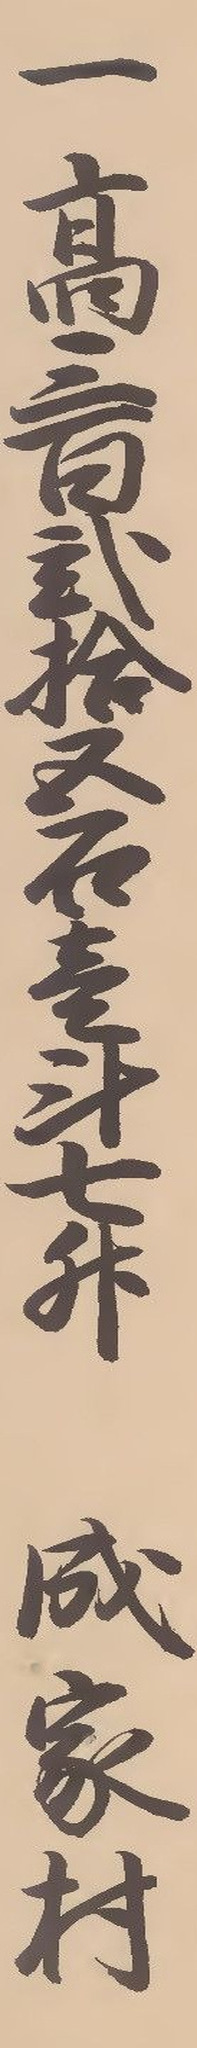一高三百弐拾五石壱斗七升成家村
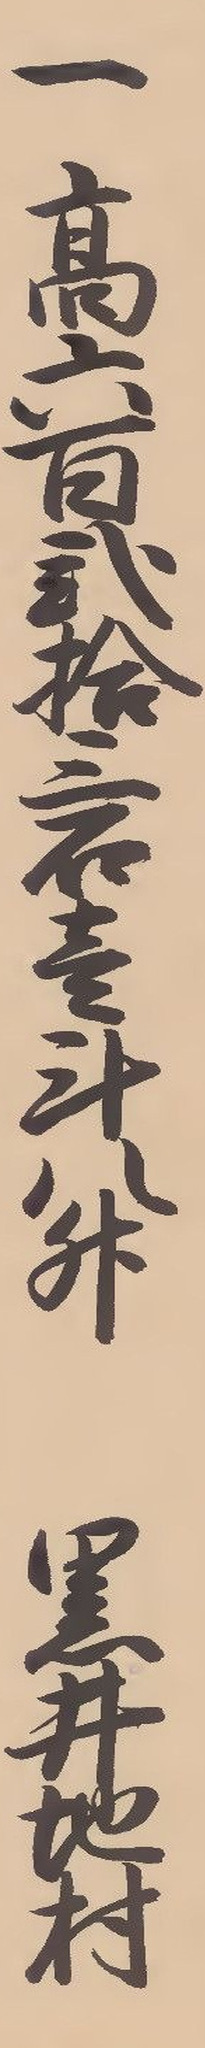一高六百弐拾三石壱斗八升黒井地村
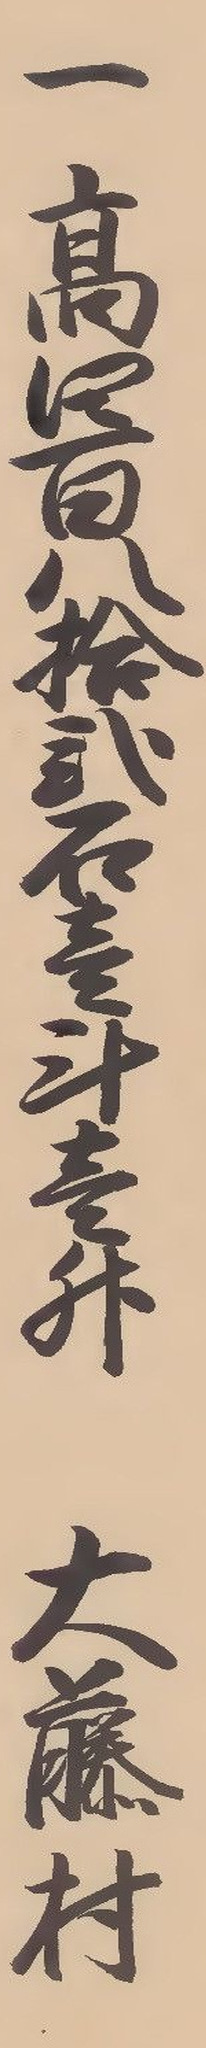一高四百八拾弐石壱斗壱升大藤村
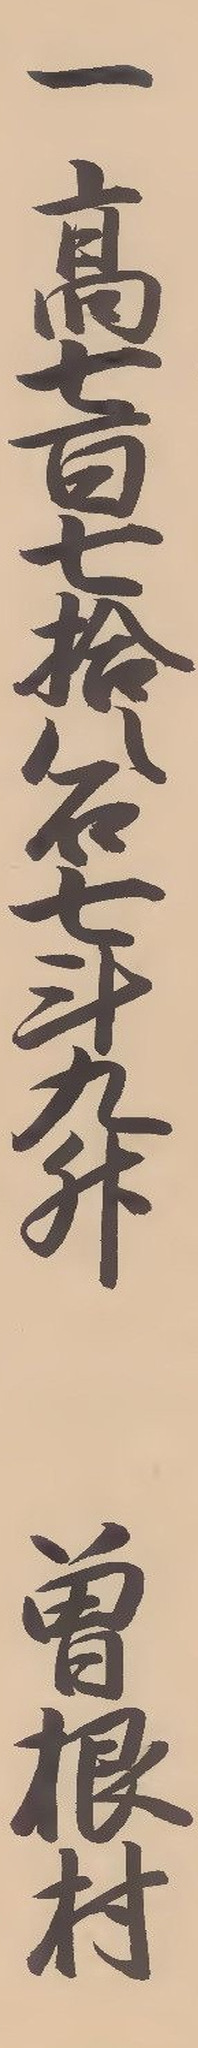一高七百七拾八石七斗九升曽根村
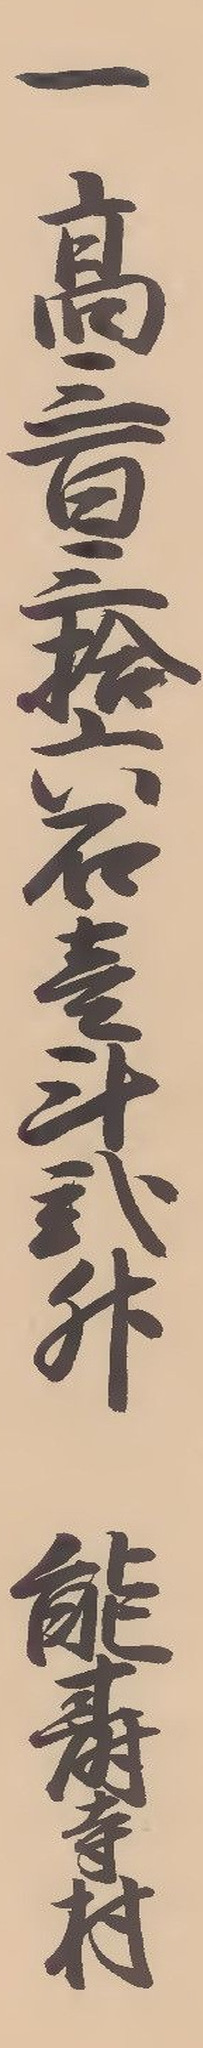一高三百三拾六石壱斗弐升能寿寺村

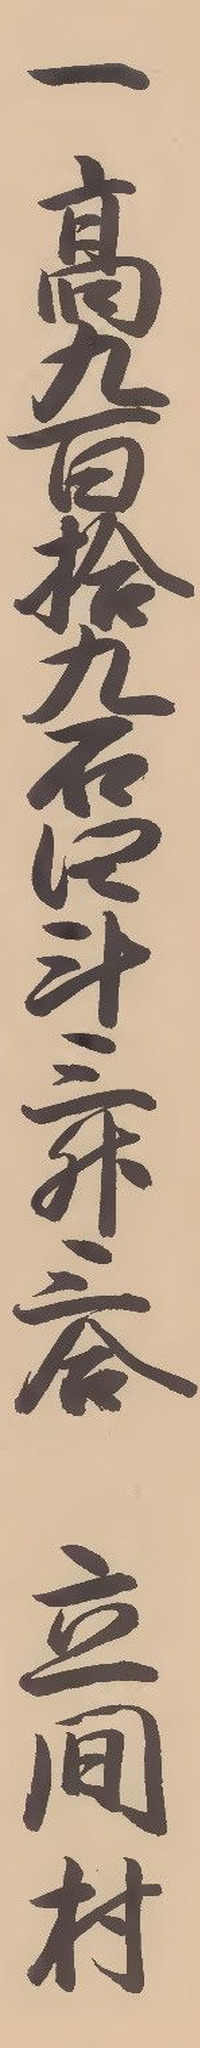一高九百拾九石四斗三升三合立間村
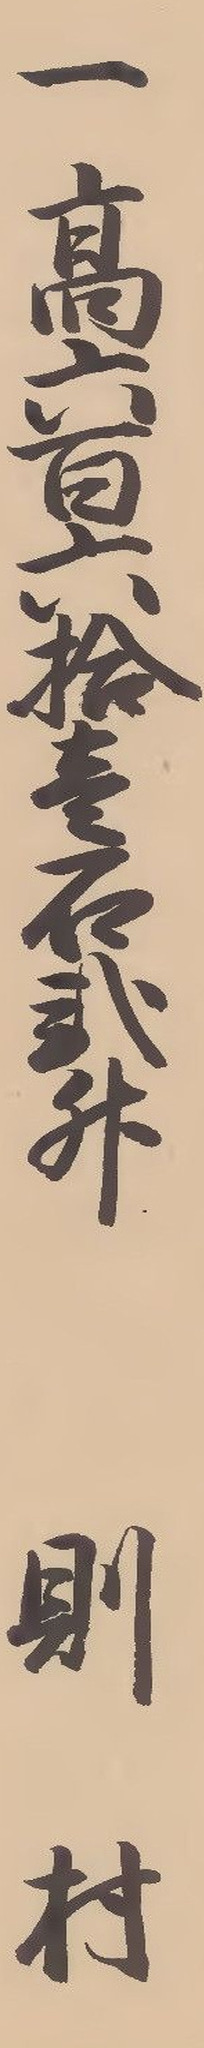一高六百六拾壱石弐升則村
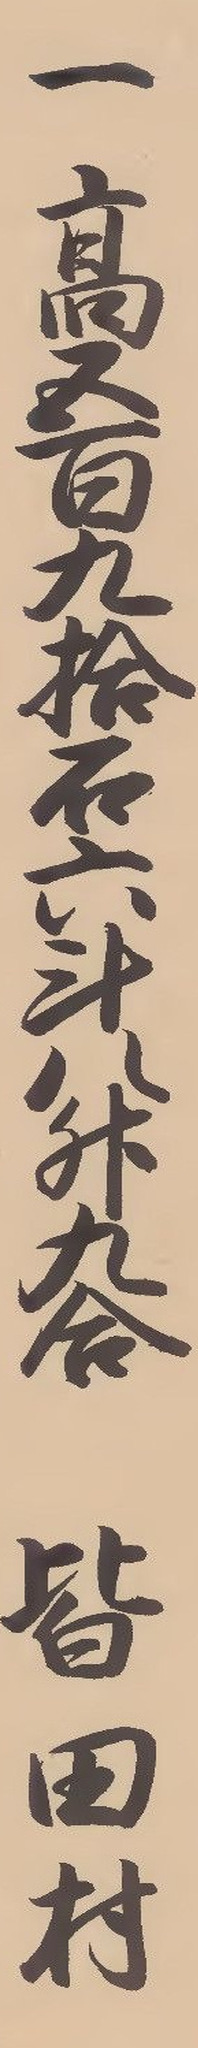一高五百九拾石六斗八升九合皆田村
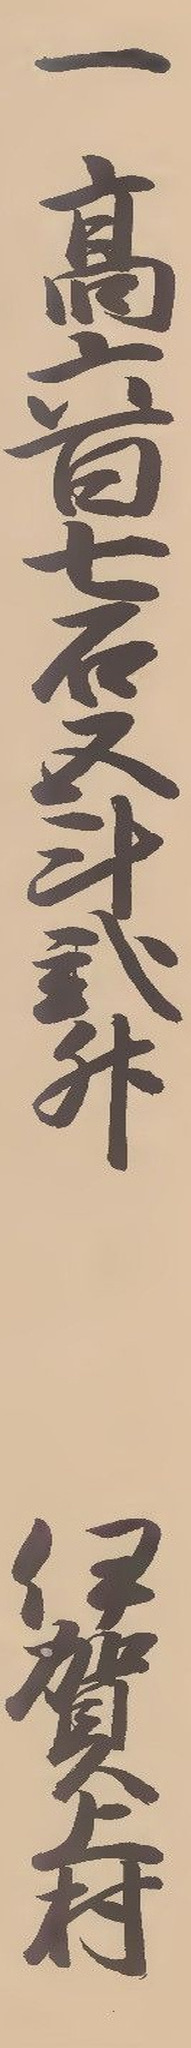一高六百七石五斗弐升伊賀上村
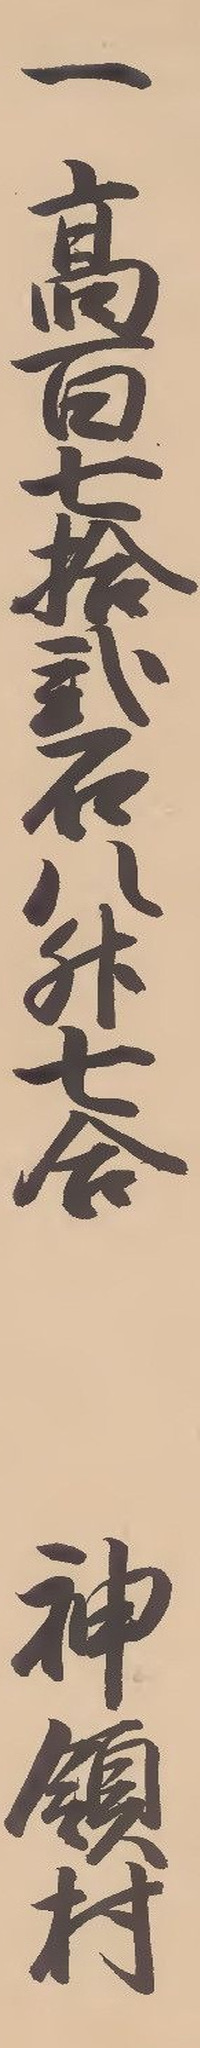一高百七拾弐石八升七合神領村
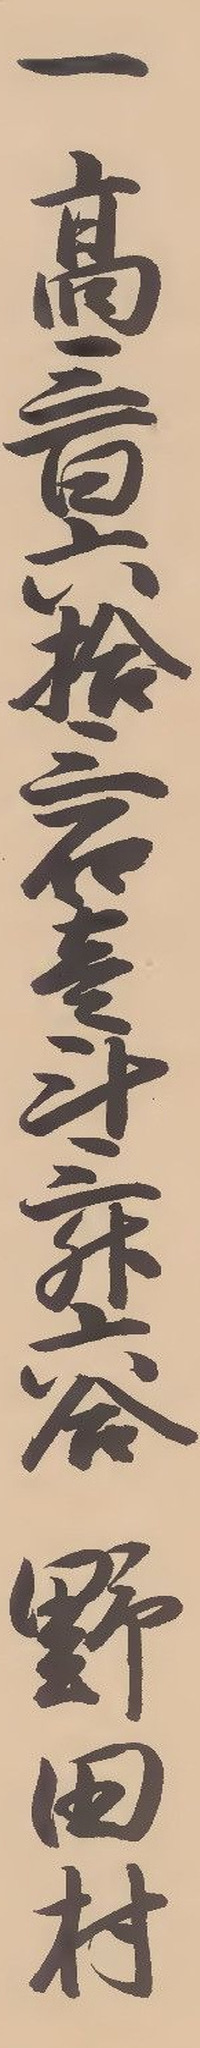一高三百六拾三石壱斗三升六合野田村
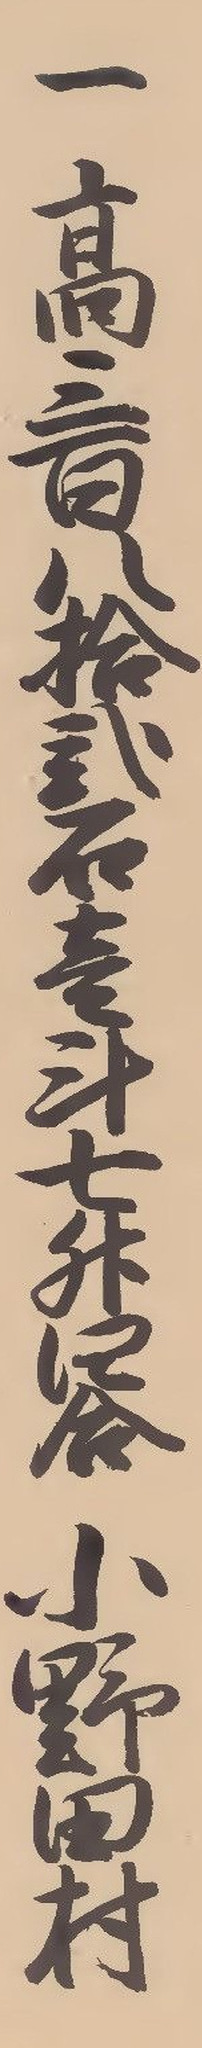一高三百八拾弐石壱斗七升四合小野田村
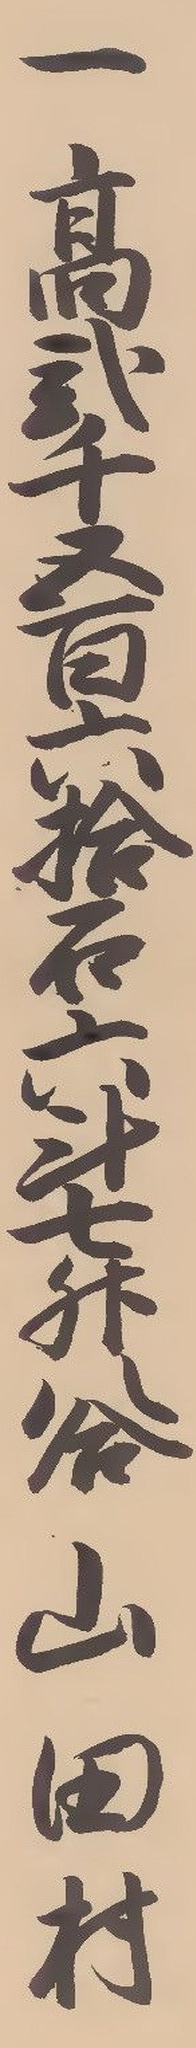一高弐千五百六拾石六斗七升八合山田村
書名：伊予国郷帳
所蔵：国立公文書館 National Archives of Japan
